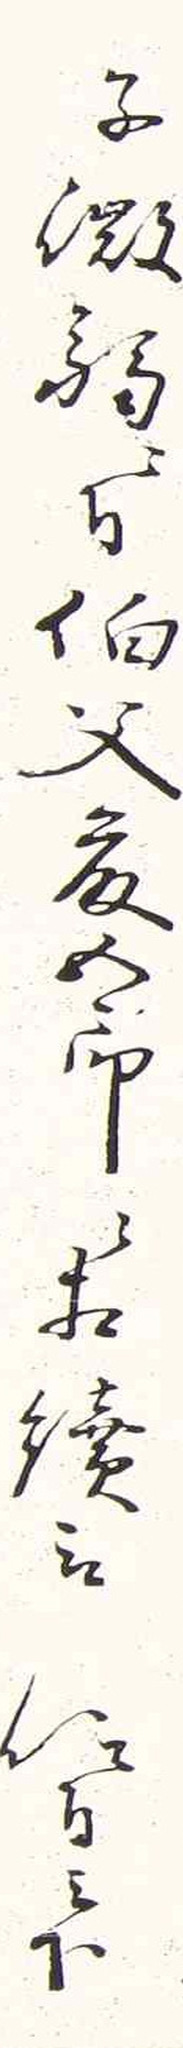子微弱ニ付伯父藤五郎ニ相続被仰付被下

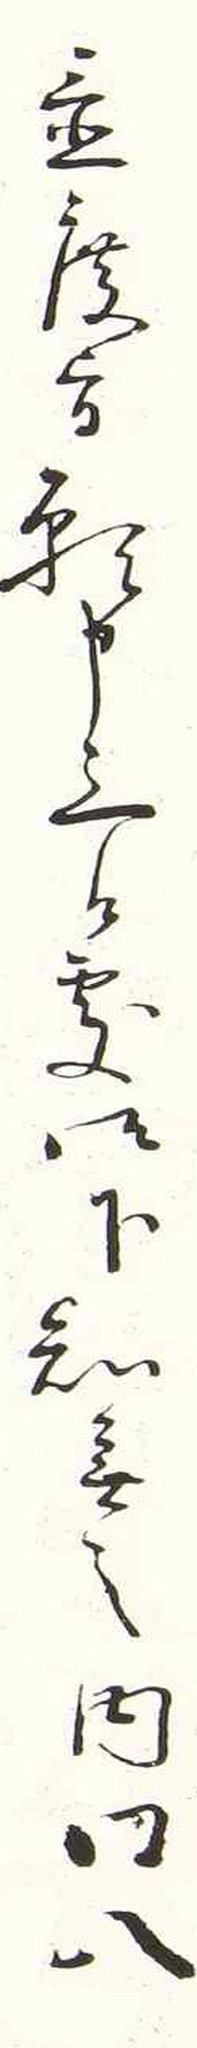置度旨願申上候処御下知無之内同八
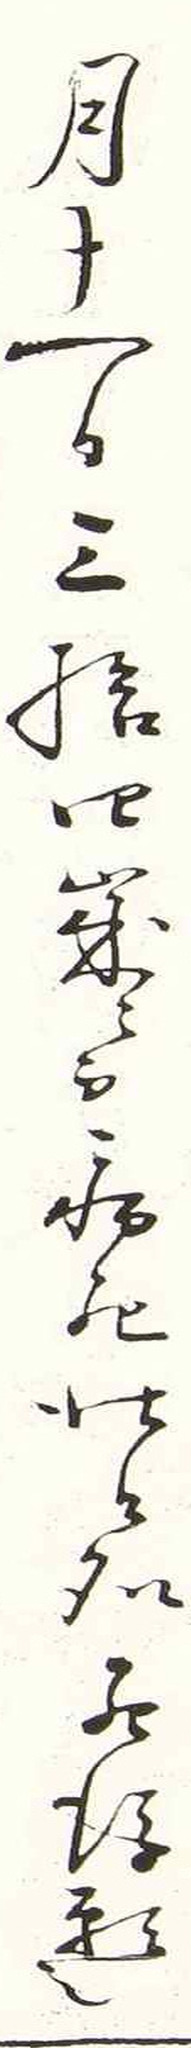月十一日三拾四歳ニ而病死仕候処死後願之
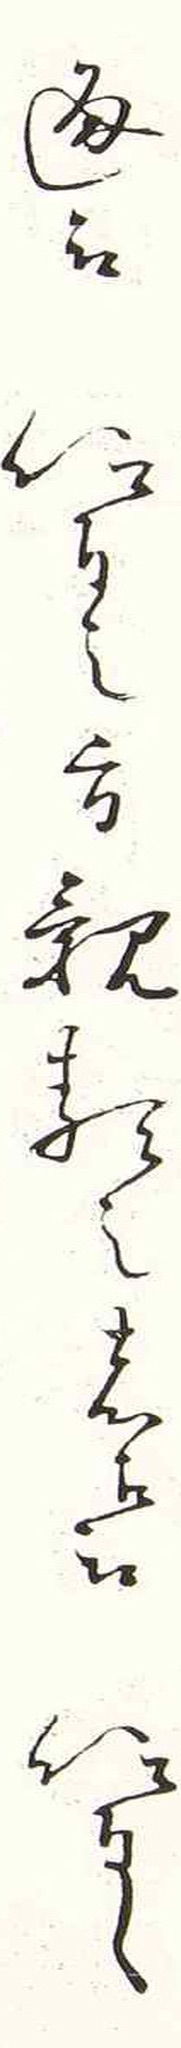通被仰付之旨親類之者江被仰付候
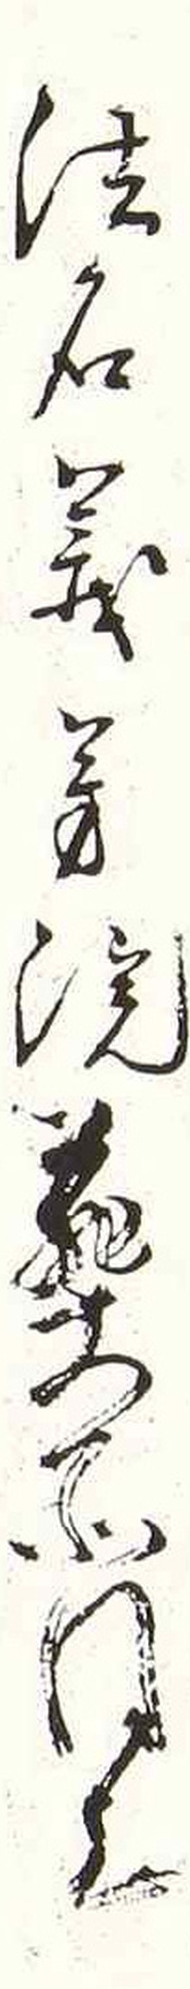法名義第院葬所同上
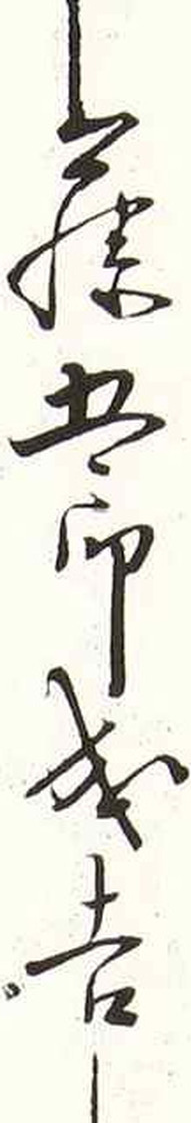藤五郎成吉
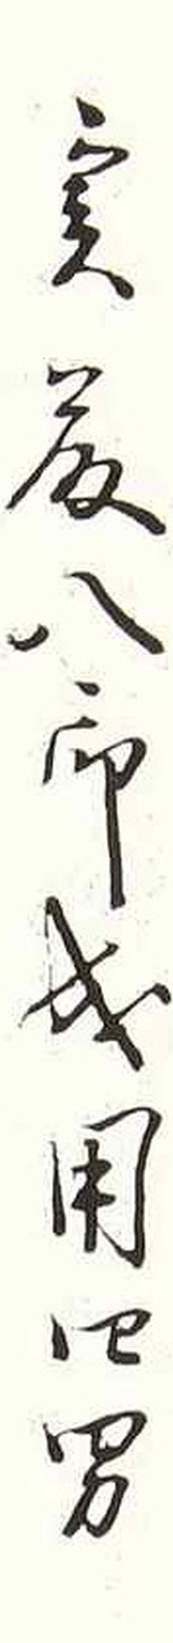実藤八郎成用四男
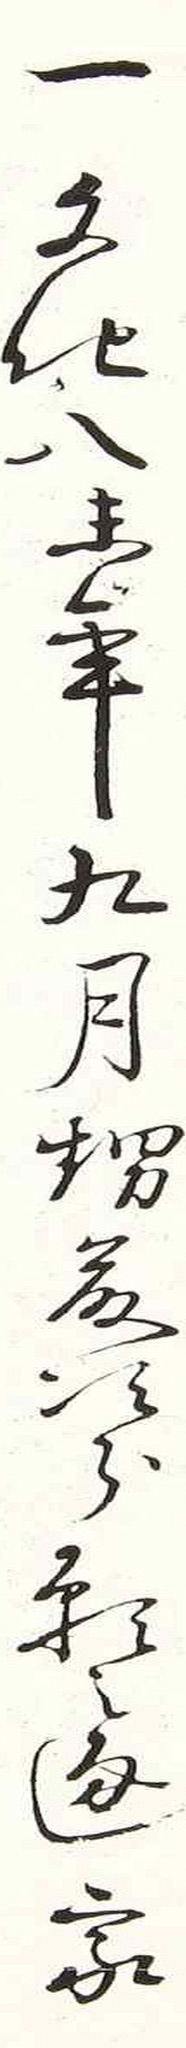一文化八未年九月甥藤次郎願之通家
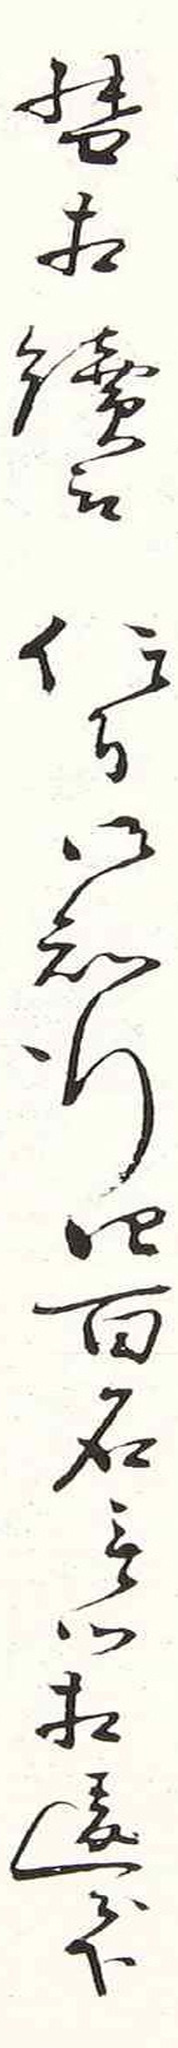督相続被仰付御知行四百石無御相違被下
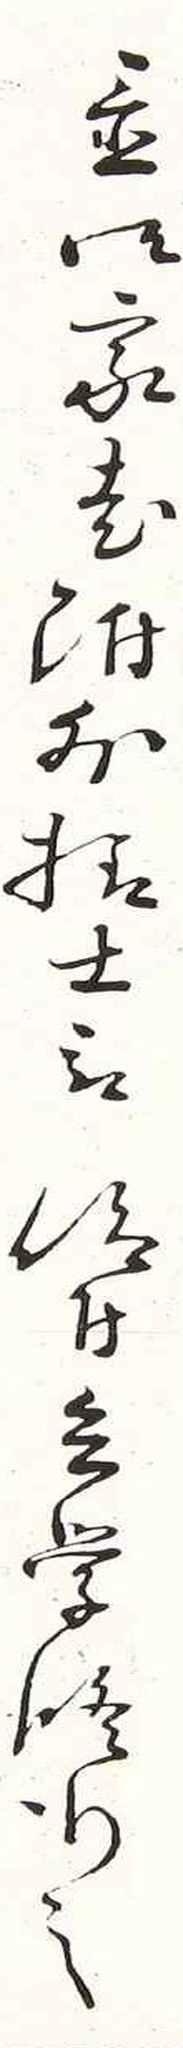置御家老附外様士被仰付兵学修行之
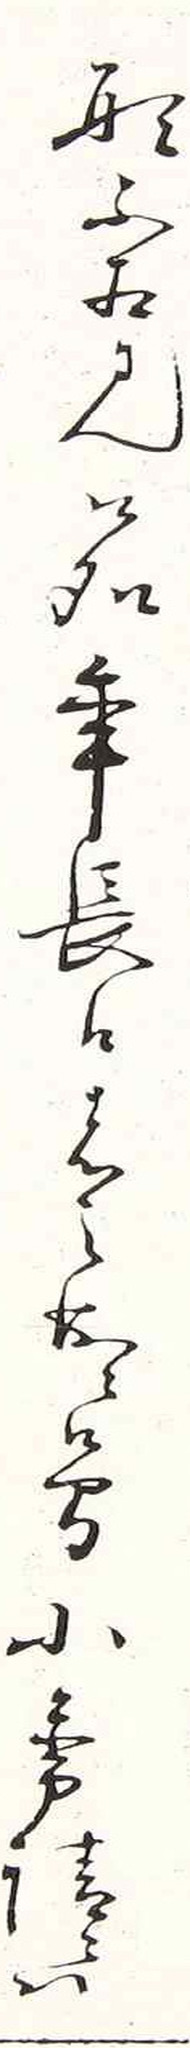形不相見候処年長候者之義ニ候間小普請ニハ
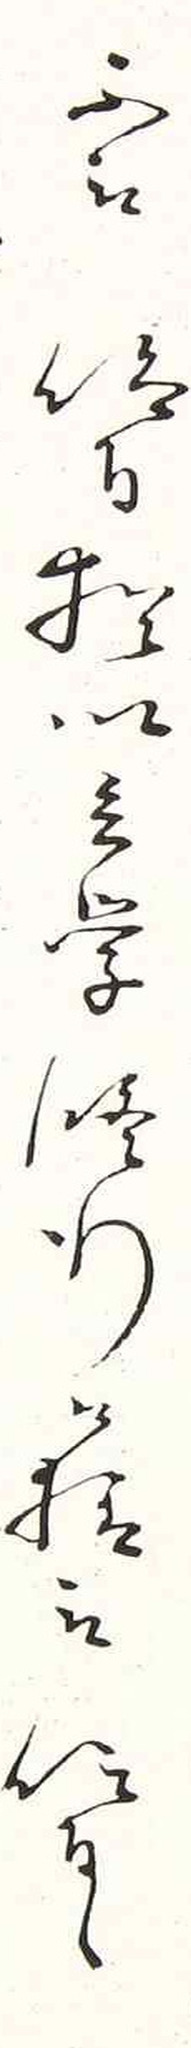不被仰付猶以兵学修行候様被仰付候
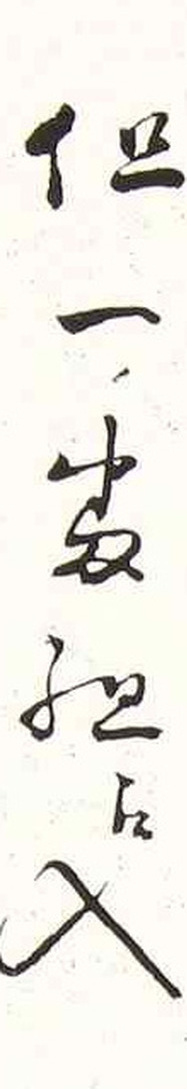但一番組江入
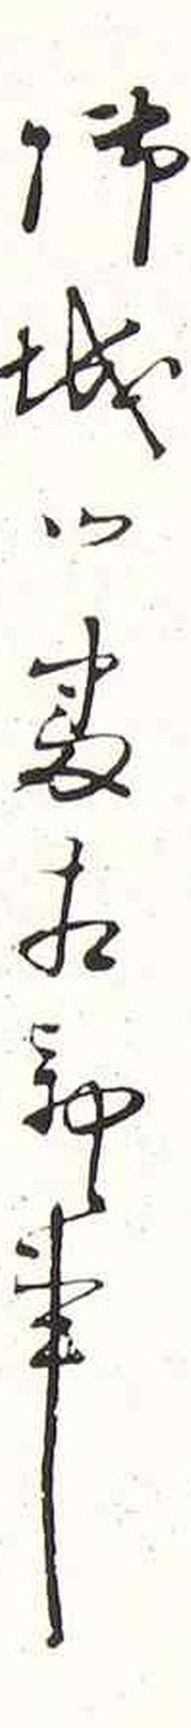御城御番相勤候事
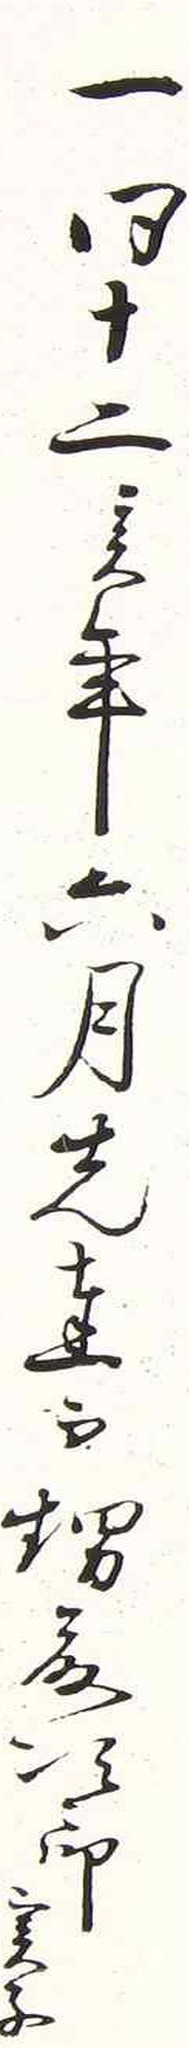一同十二亥年六月先達而甥藤次郎実子
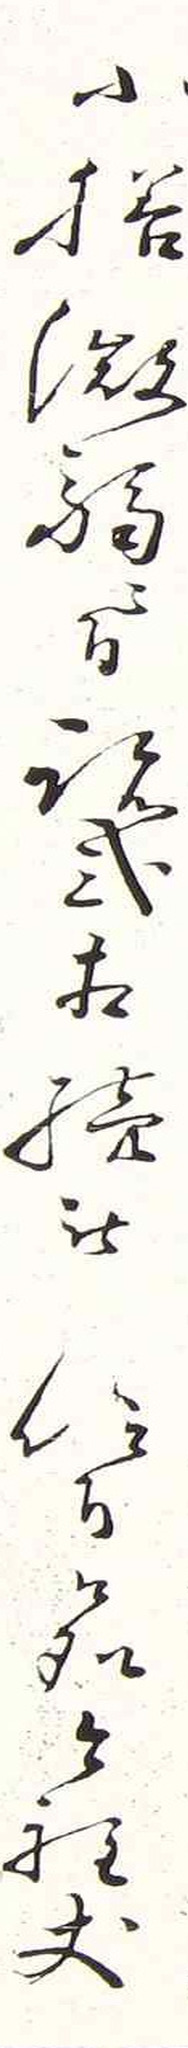小膳微弱ニ付跡式相続被仰付候処今程丈
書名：諸士系譜　巻之357　す之部7
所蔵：会津若松市立会津図書館
